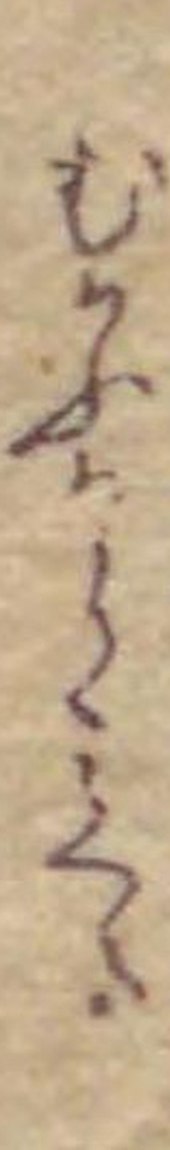むかふからみへる

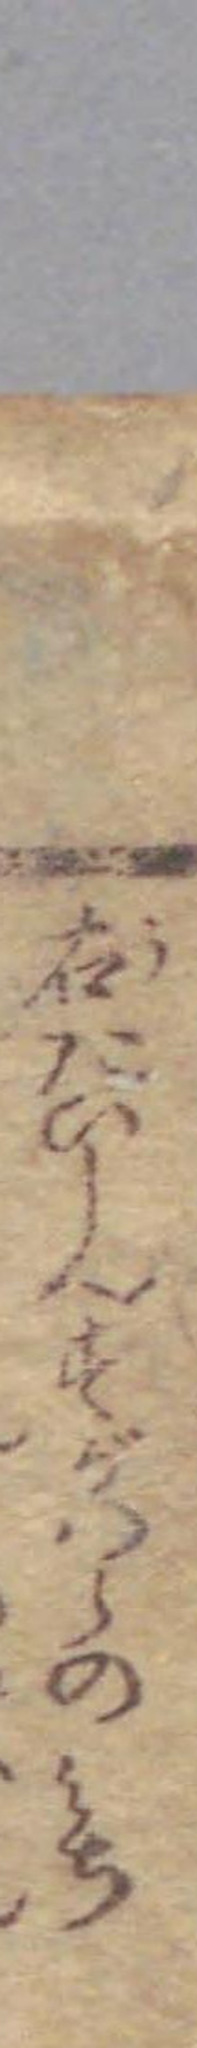右たいしんすがはらのみち
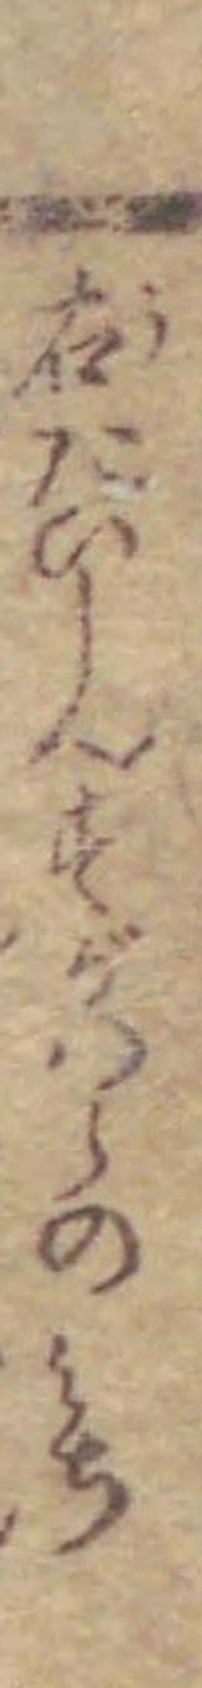右たいしんすがはらのみち
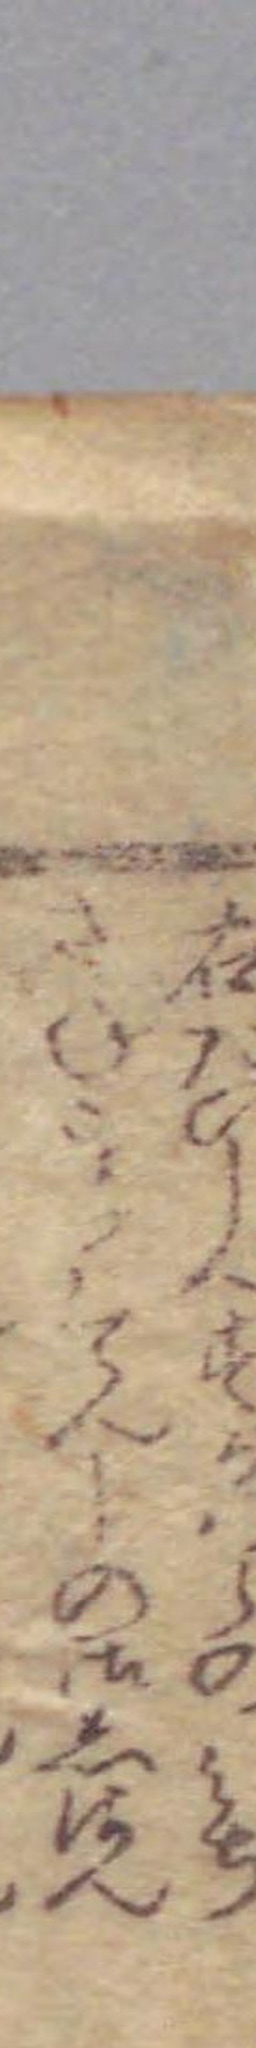さねこはてんしの御しはん
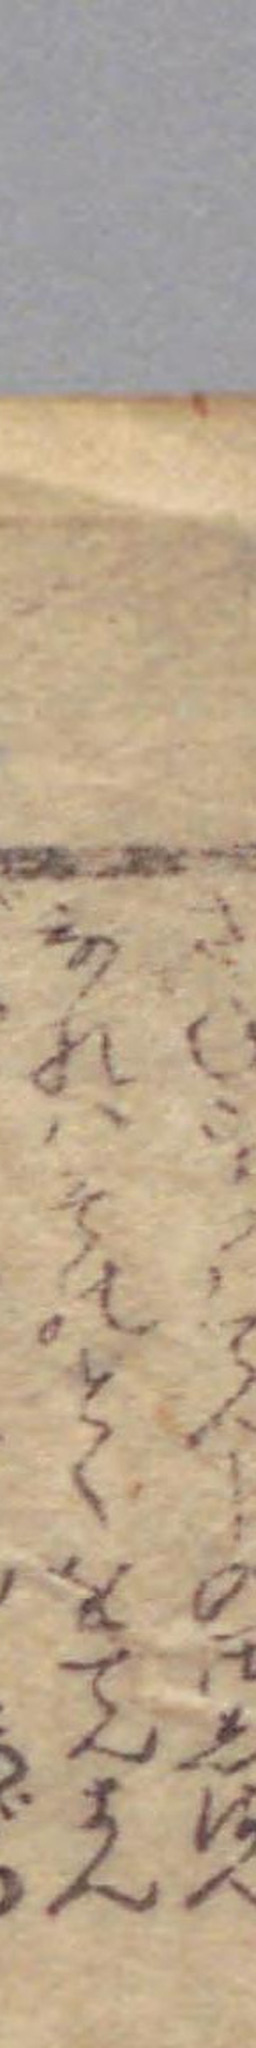なれはそのとくをてんまん
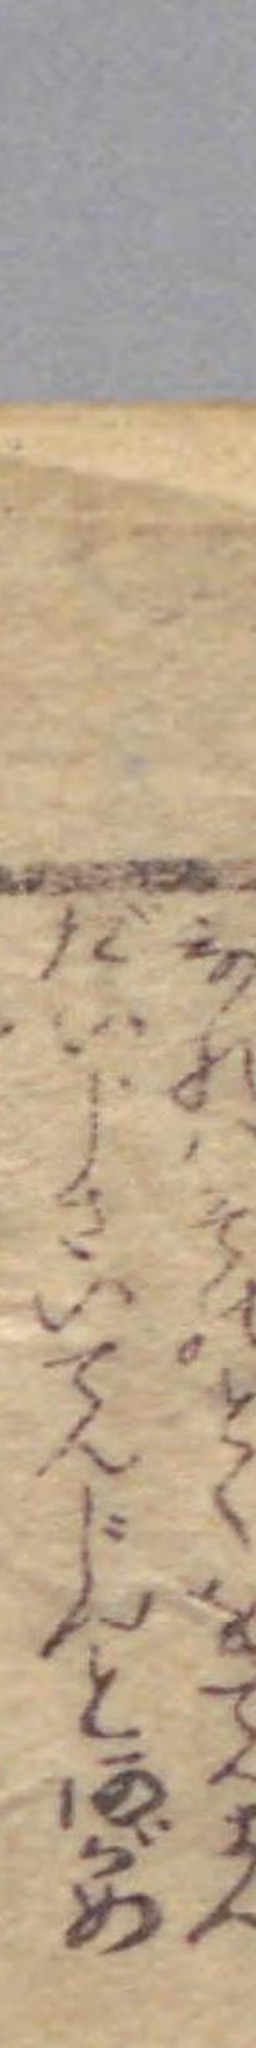だいじさいてんじんとあがめ
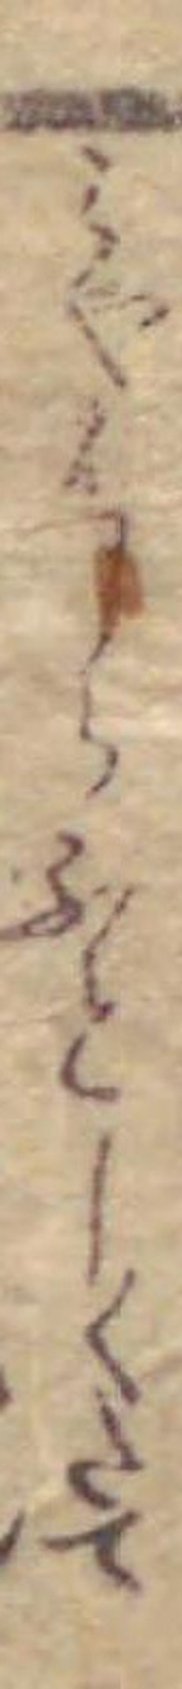みやはしらふとくしてたて
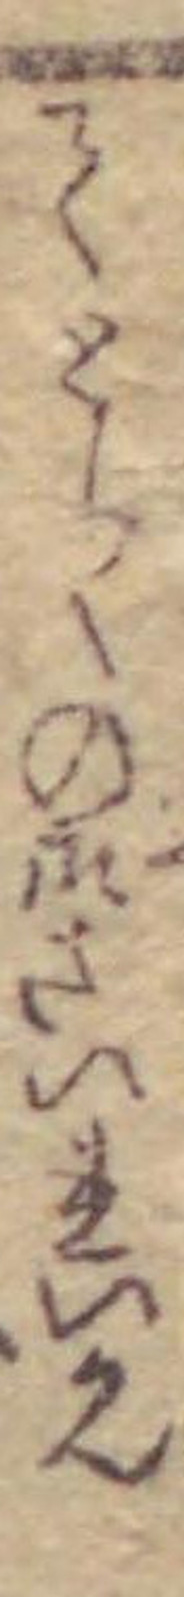てとし〳〵の御さいれいかん
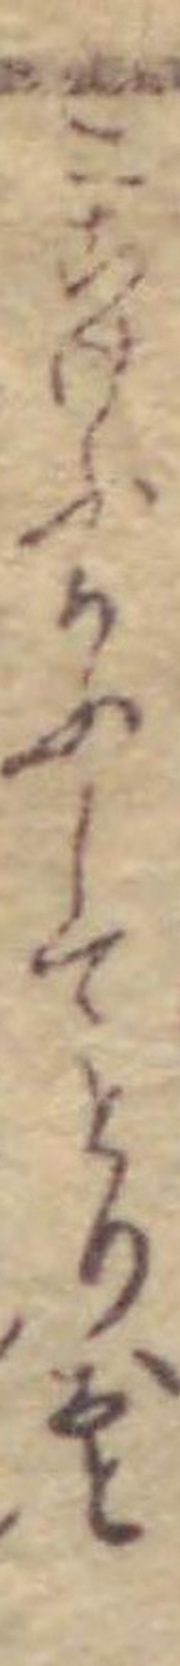こす？けふかふしてとりおと
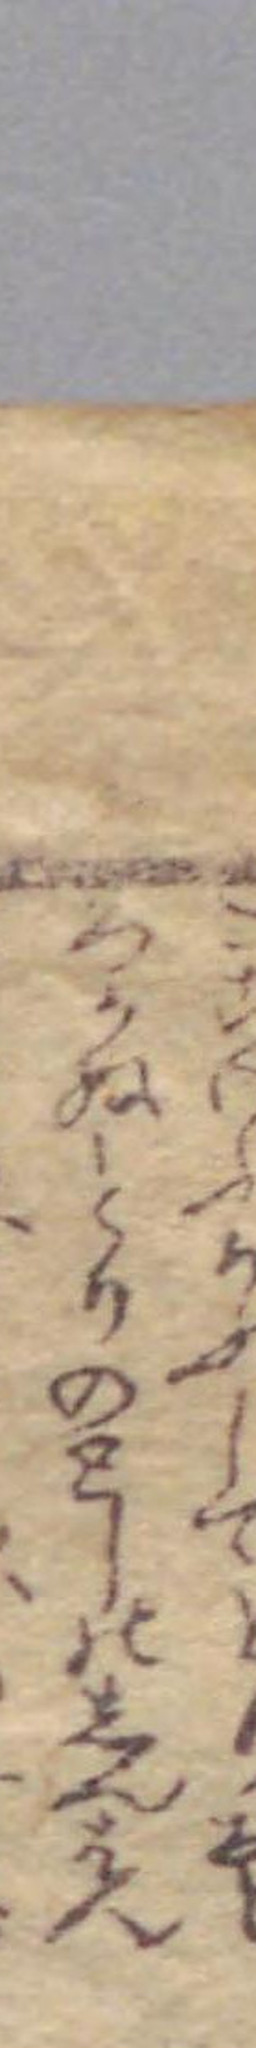ろかぬとりのとしのしんはん
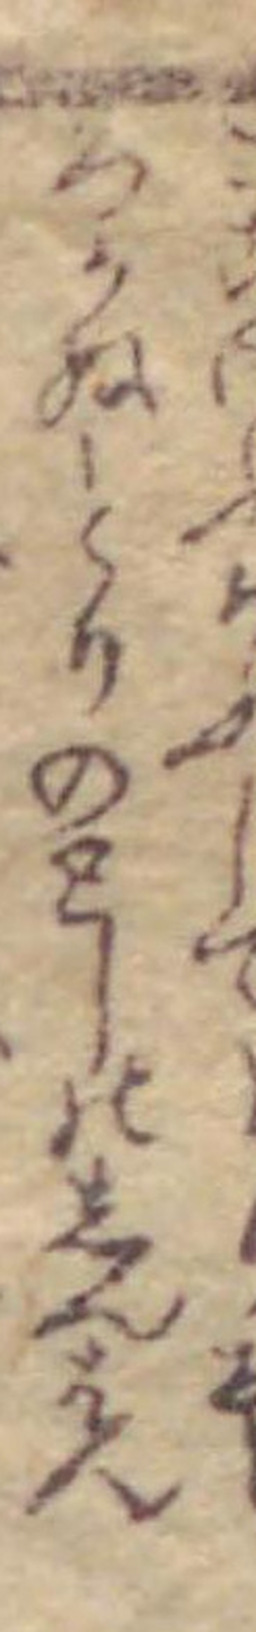ろかぬとりのとしのしんはん
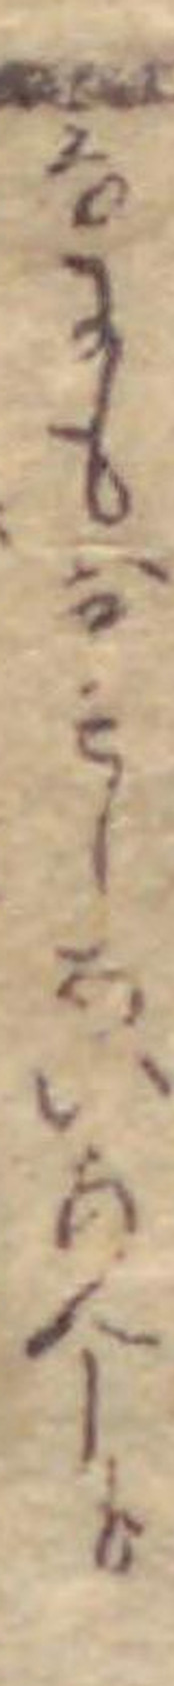なにもおもしろいあんしも
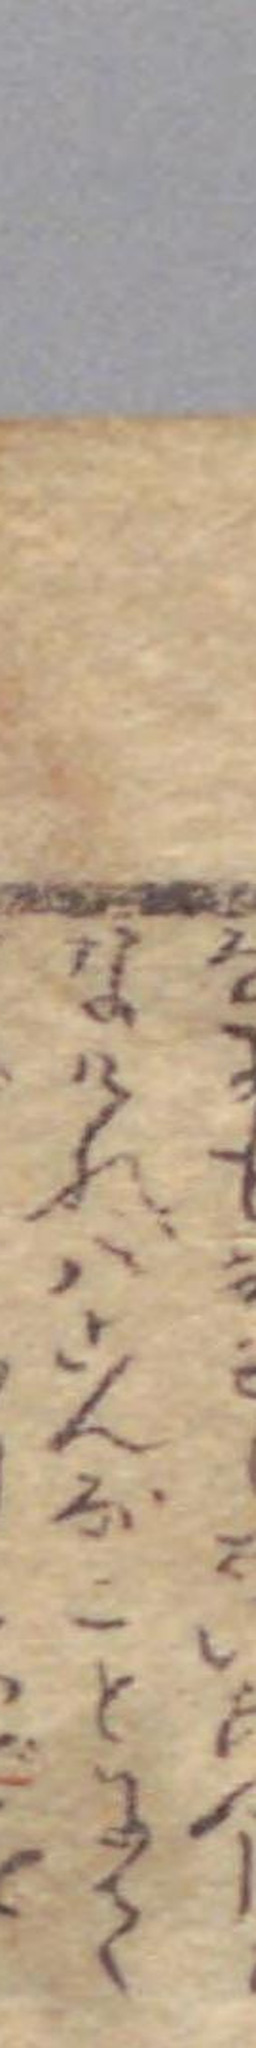なけれはこんなことにて
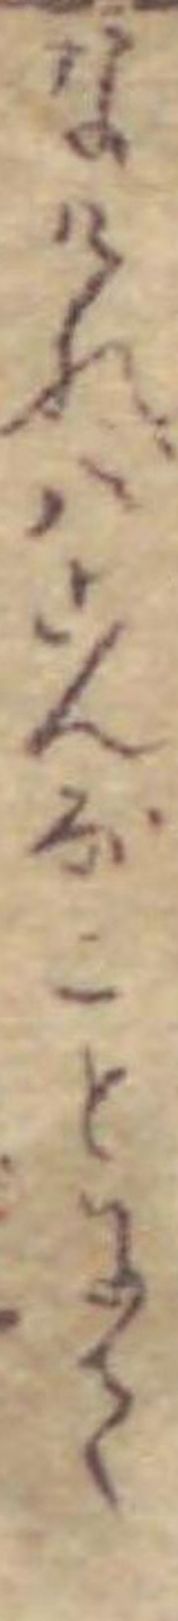なけれはこんなことにて
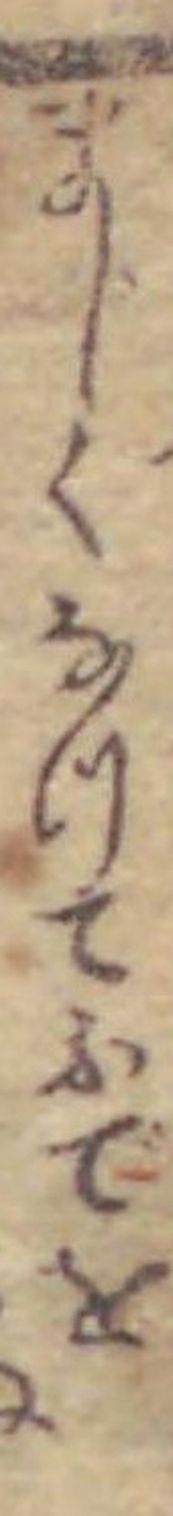ましくなつてふでを
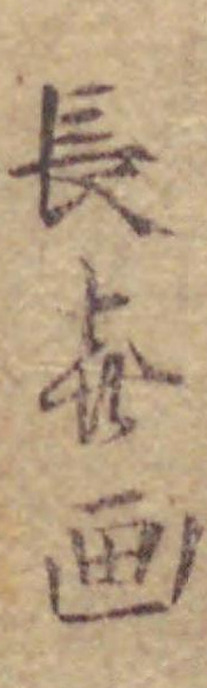長喜画
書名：天下一面鏡梅鉢 : 3巻
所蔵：国立国会図書館 National Diet Library, JAPAN
